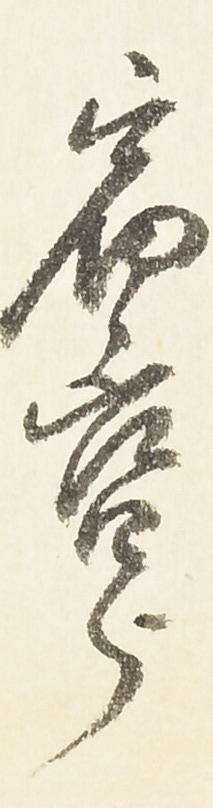宿善四郎
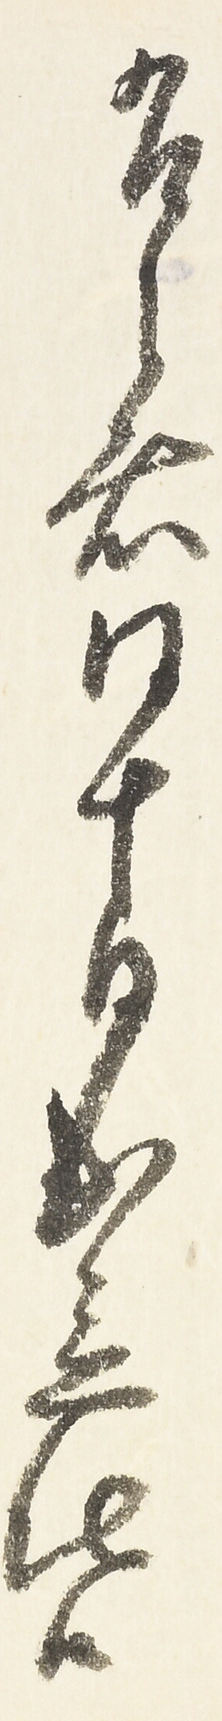右之者同十日出立仕候
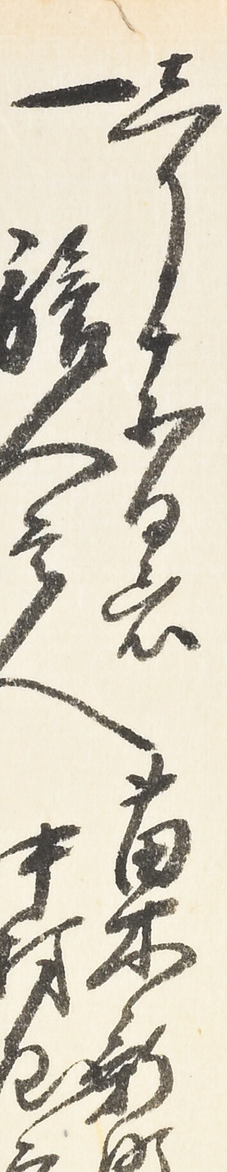十二月十五日着苗木新町
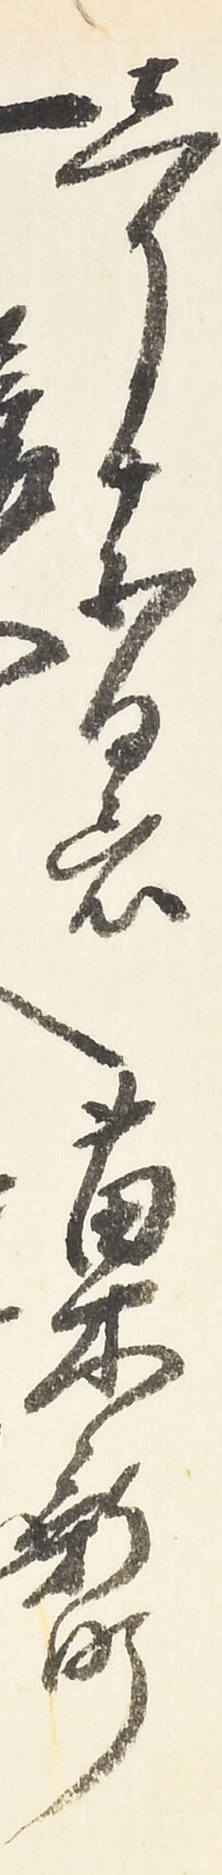十二月十五日着苗木新町
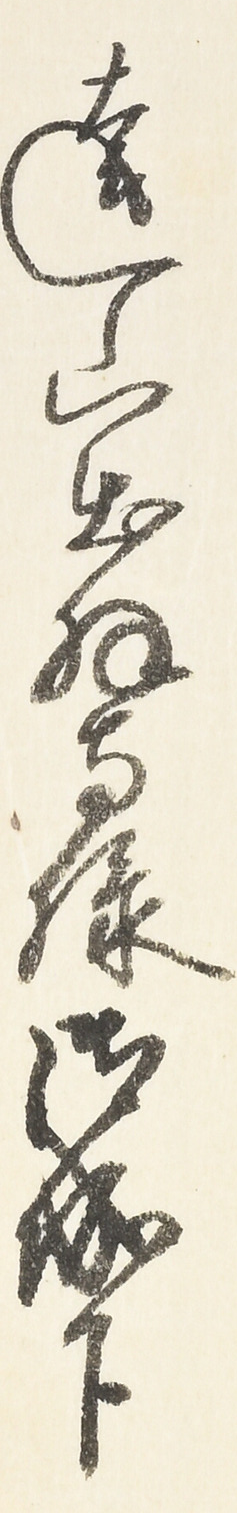遠山出羽守様御城下
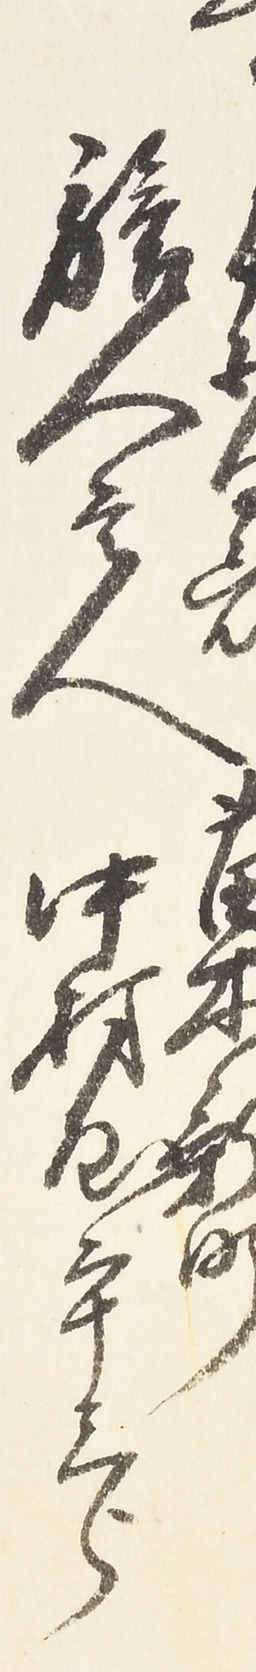一旅人壱人中村屋平三郎
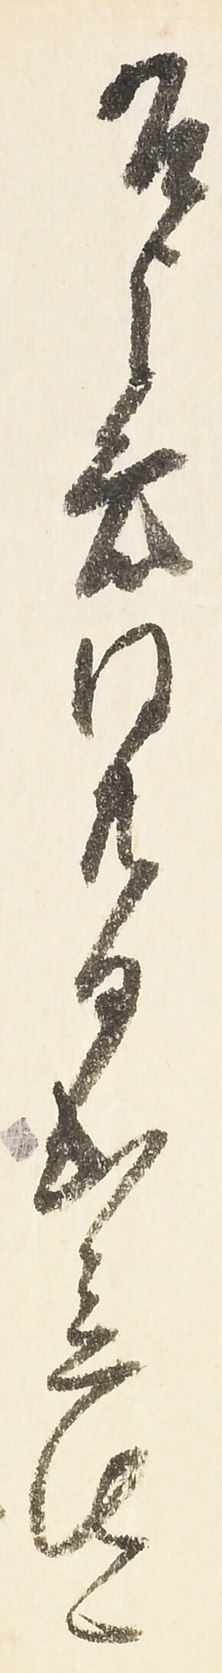右之者同廿日出立仕候
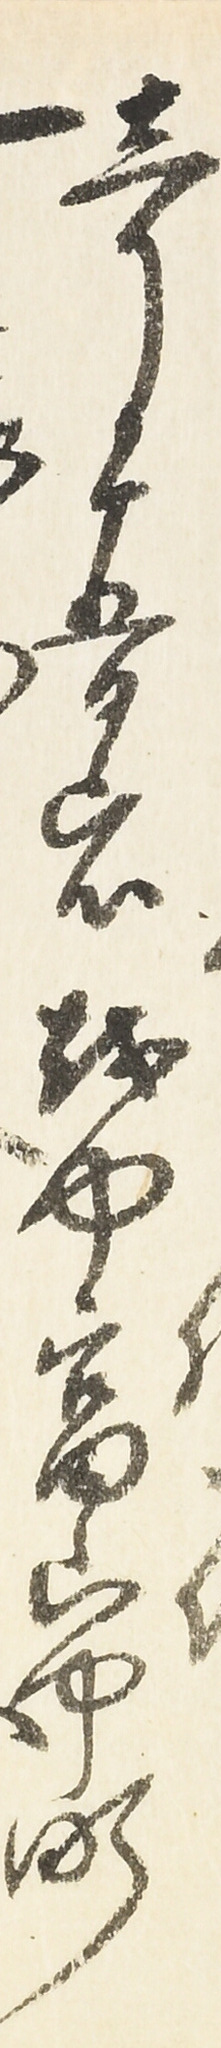十二月十五日着越中富山中町
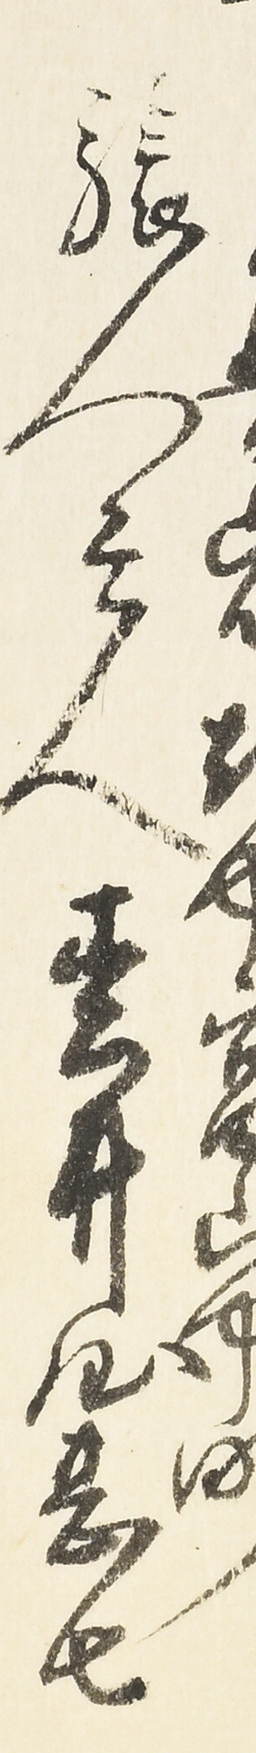一旅人壱人松井屋甚七
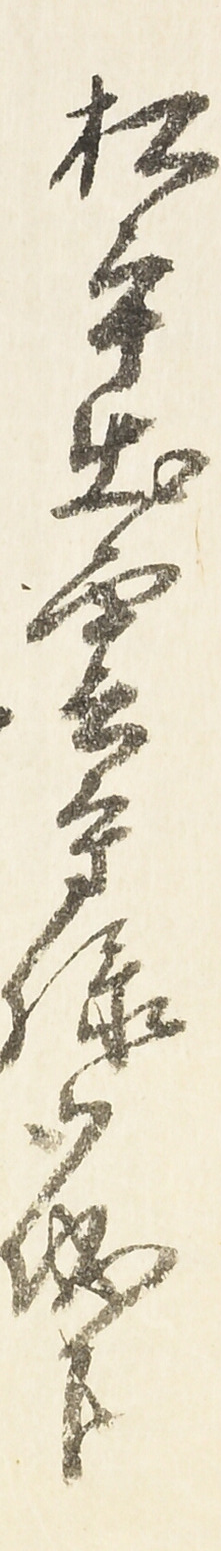松平出雲守様御城下
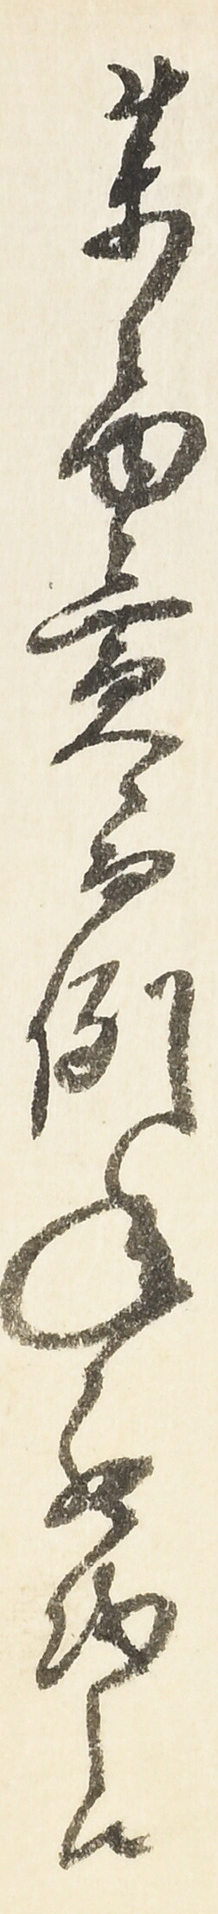薬商売ニ而例年罷越申候
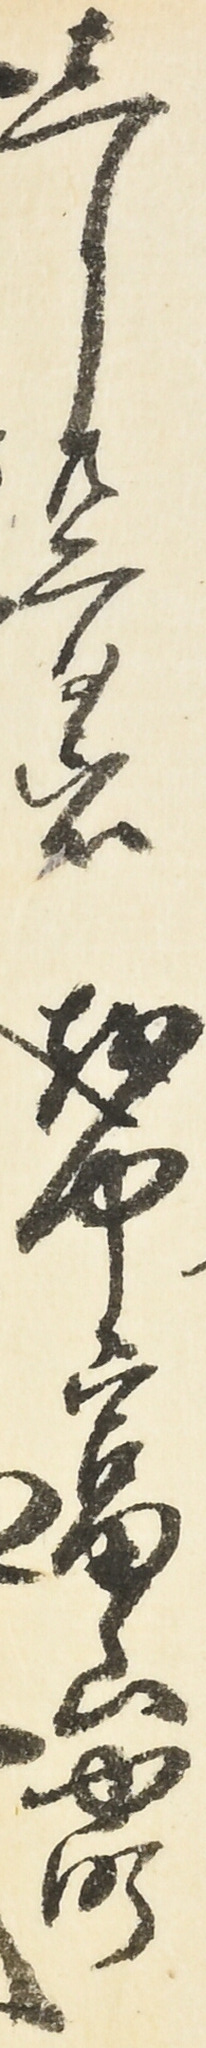十二月廿二日着越中富山中町
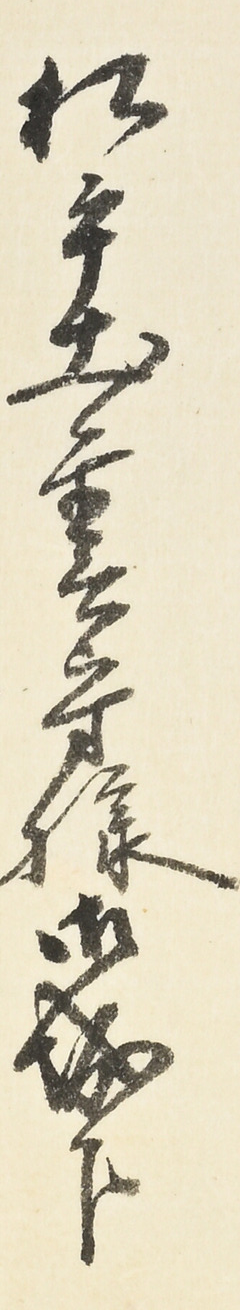松平出雲守様御城下
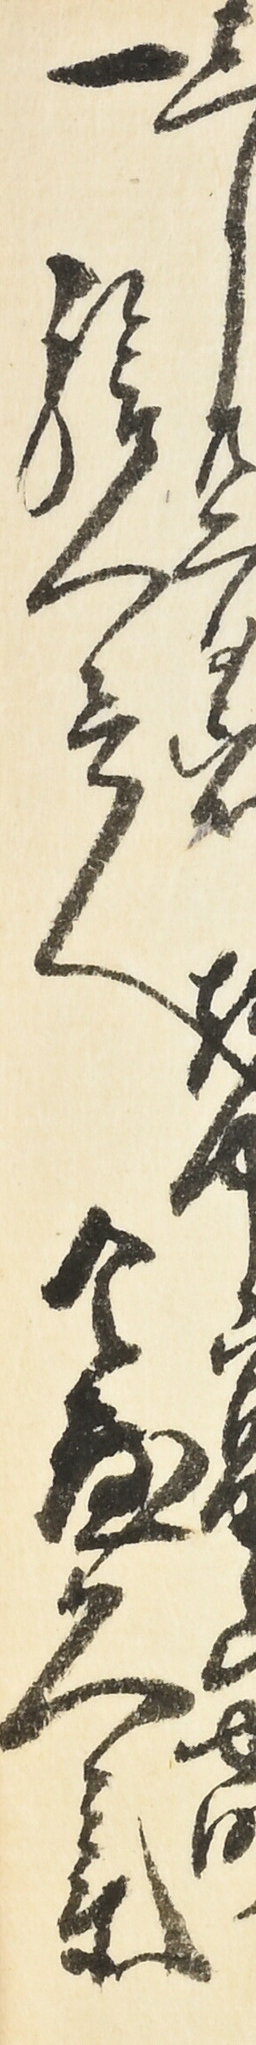一旅人壱人金屋久兵衛
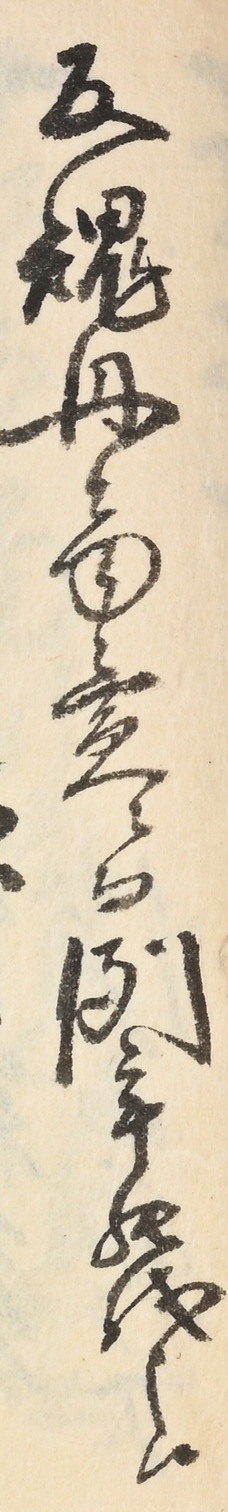小道具商売ニ而例年罷越申候

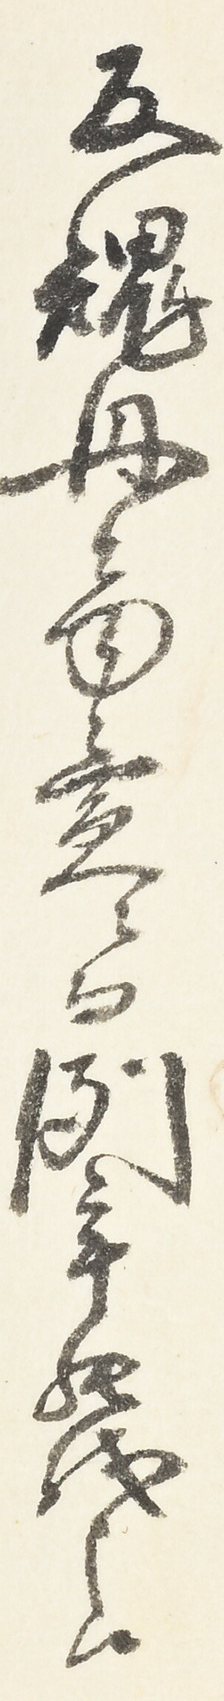反魂丹商売ニ而例年罷越申候
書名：町中旅人泊控帳
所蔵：伊那市立高遠町図書館・合同会社AMANE
